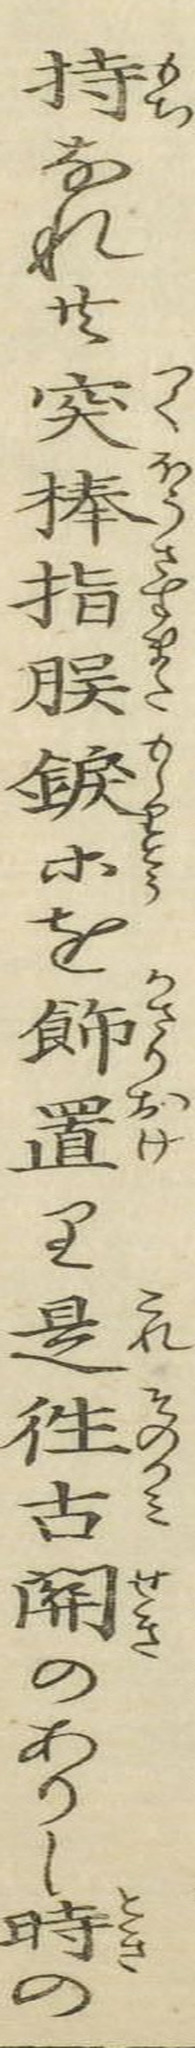持なれ共突棒指脵錑等を飾置り是往古関のありし時の
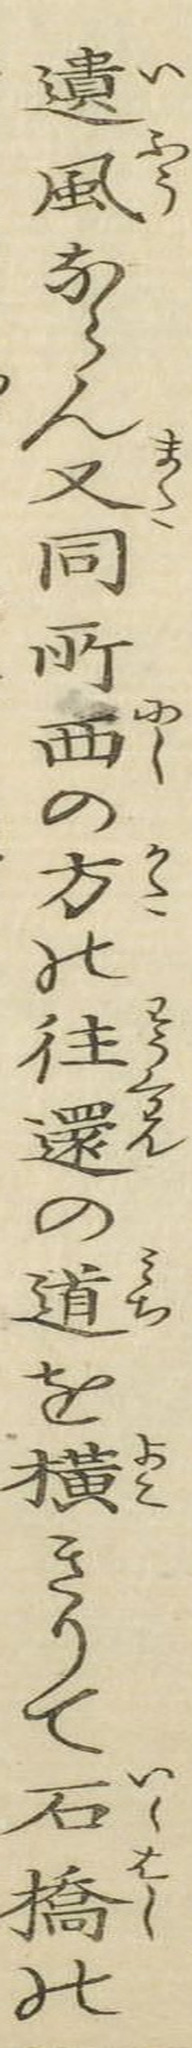遺風ならん又同所西の方の往還の道を横きりて石橋の
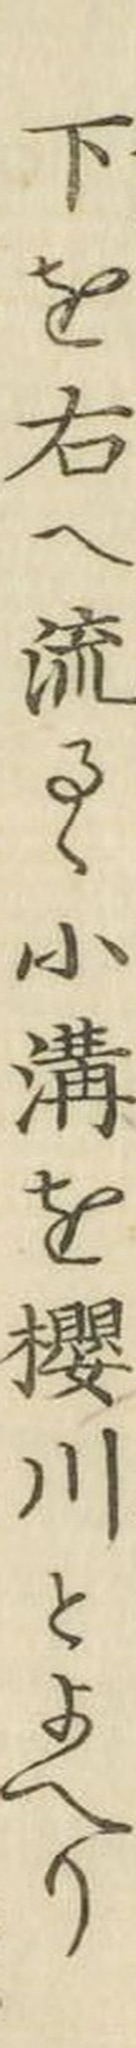下を右へ流るゝ小溝を桜川とよへり

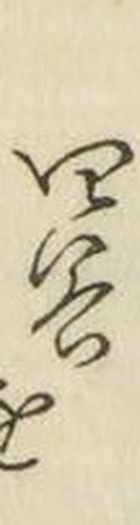四谷を
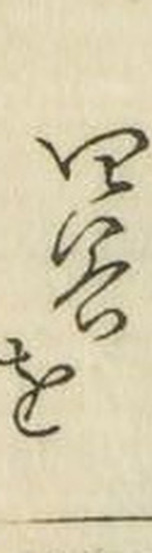四谷を
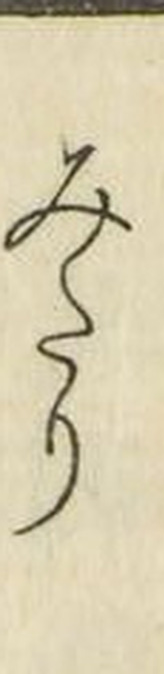みたり

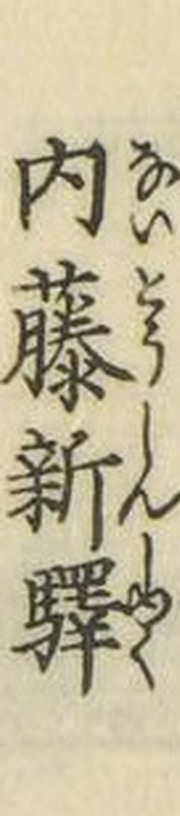内藤新駅
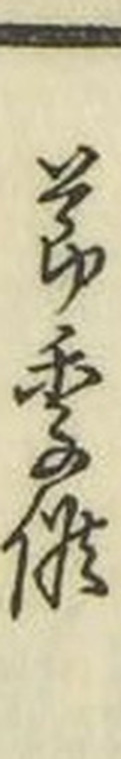節季候
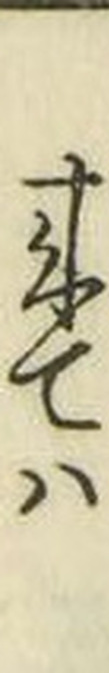来ては
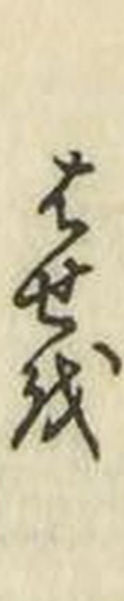はせを
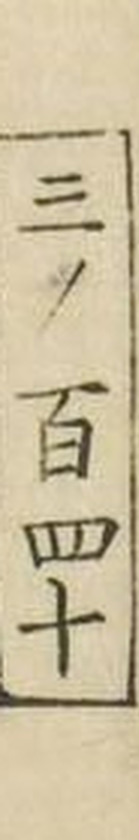三ノ百四十

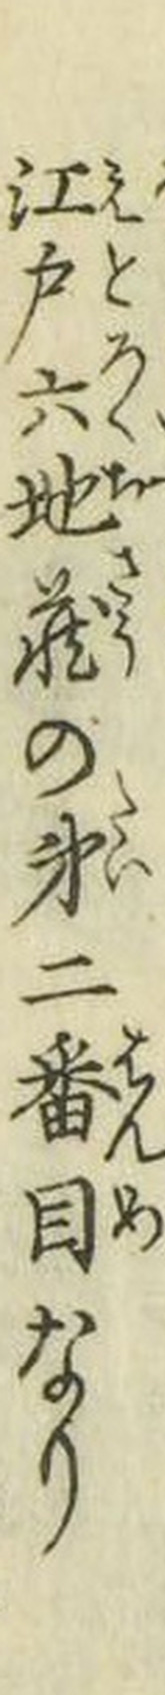江戸六地蔵の第二番目なり
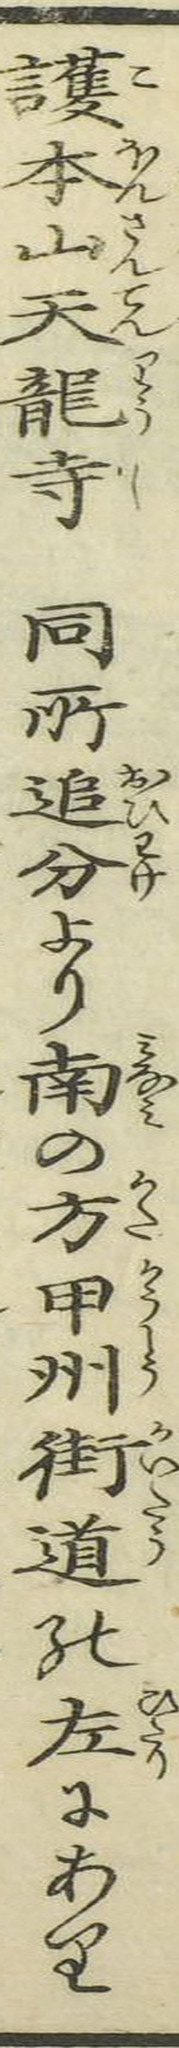護本山天龍寺同所追分より南の方甲州街道の左にあり
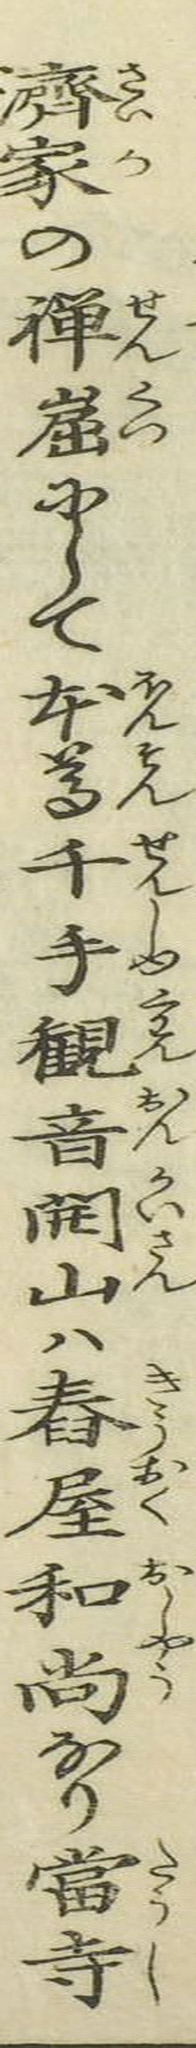済家の禅崫にして本尊千手観音開山は舂屋和尚なり当寺
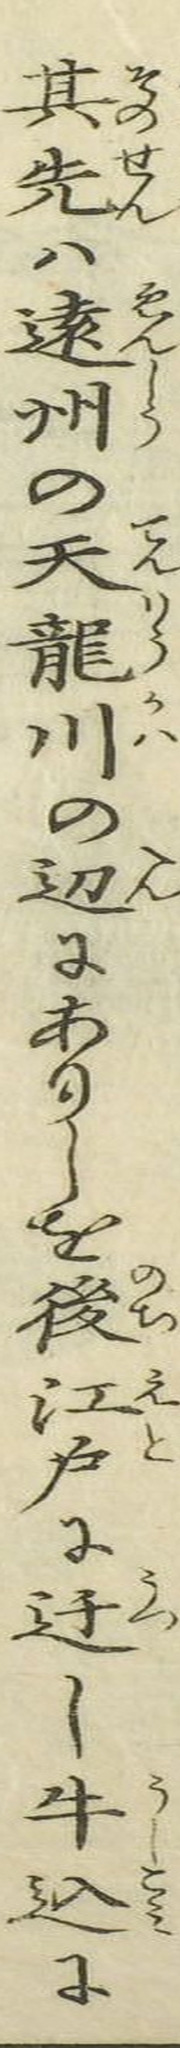其先は遠州の天竜川の辺にありしを後江戸に迁し牛込に
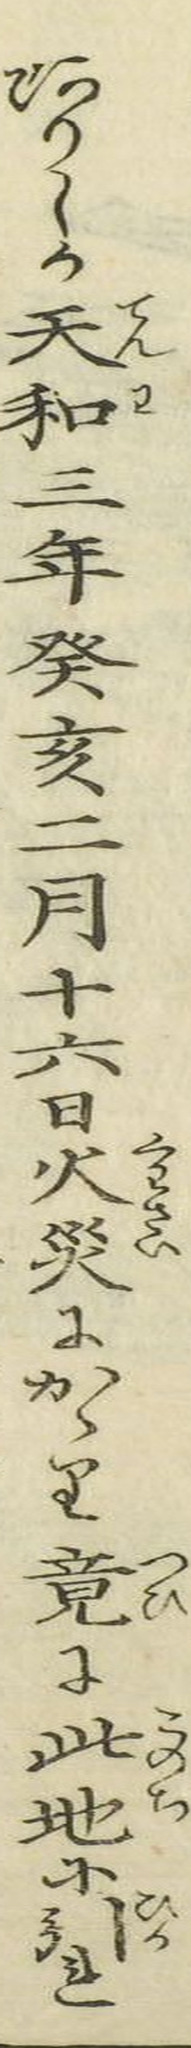ありしか天和三年癸亥二月十六日火災にかゝり竟に此地に引れ
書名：江戸名所図会 20巻 巻之9
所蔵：東京学芸大学教育コンテンツアーカイブ
